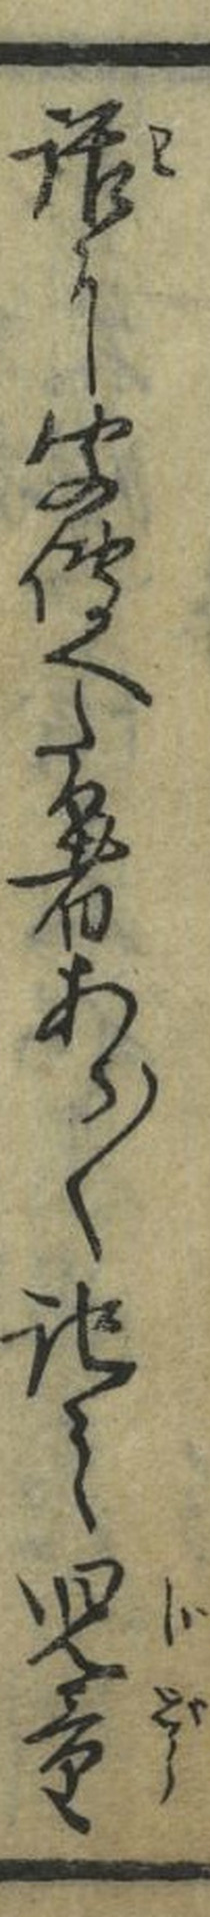話に聞伝へたる者あら〳〵記し児童
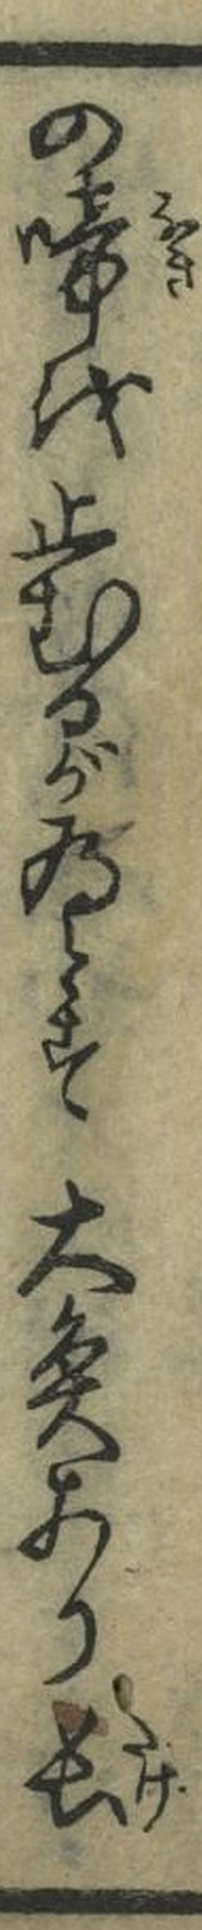の啼を止むるが為とす大魚あり長
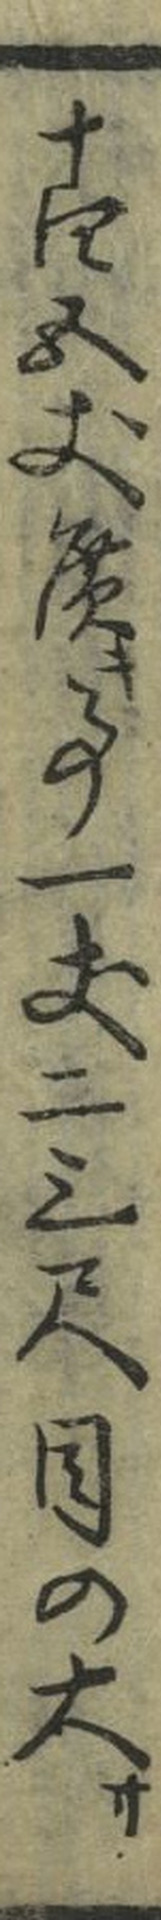十四五丈広き事一丈二三尺目の大さ
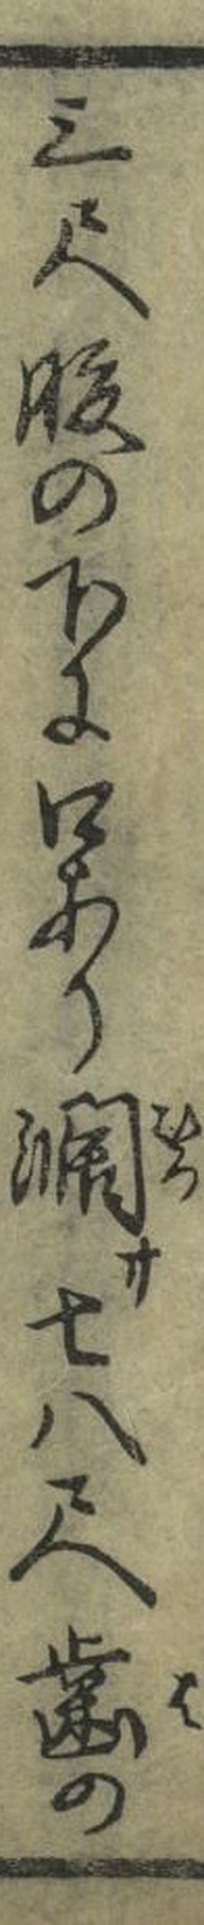三尺腹の下に口あり濶さ七八尺歯の
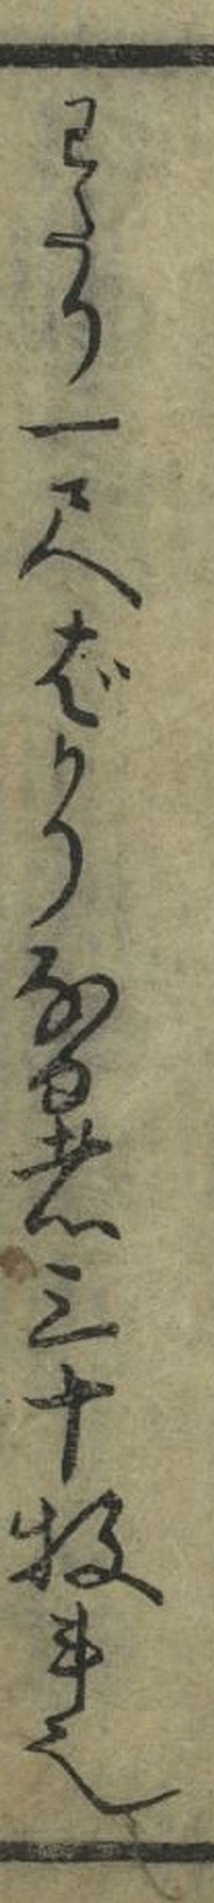わたり一尺ばかりなるは三十枚斗也

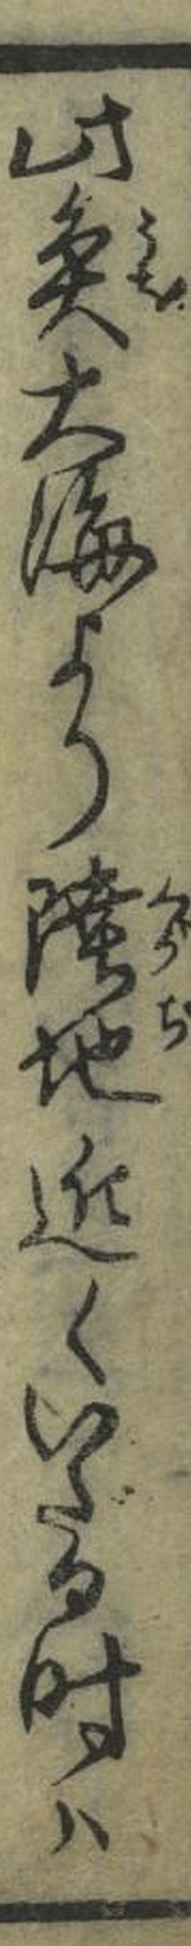此魚大海より陸地近くいたる時は
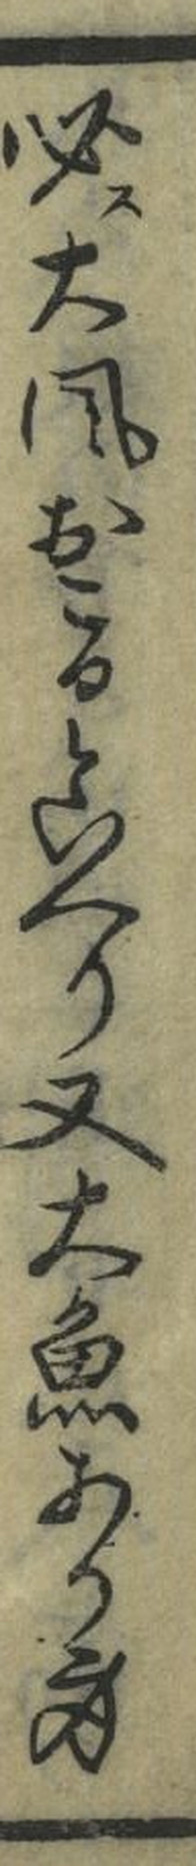必す大風おこるといへり又大魚あり身
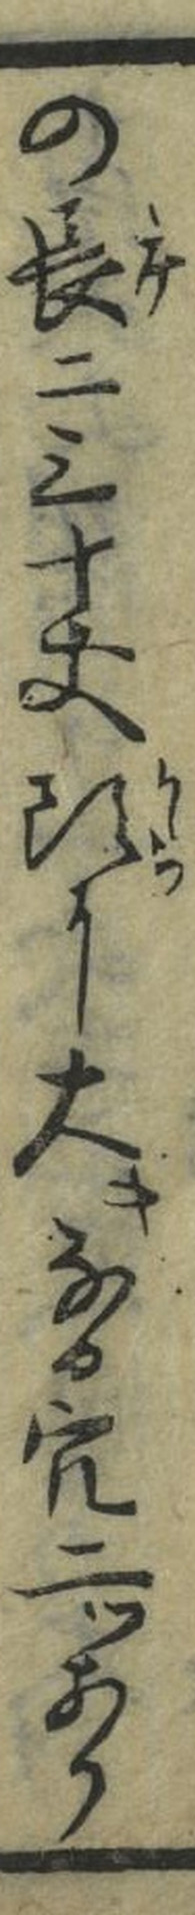の長二三十丈頭に大きなる穴二ツあり
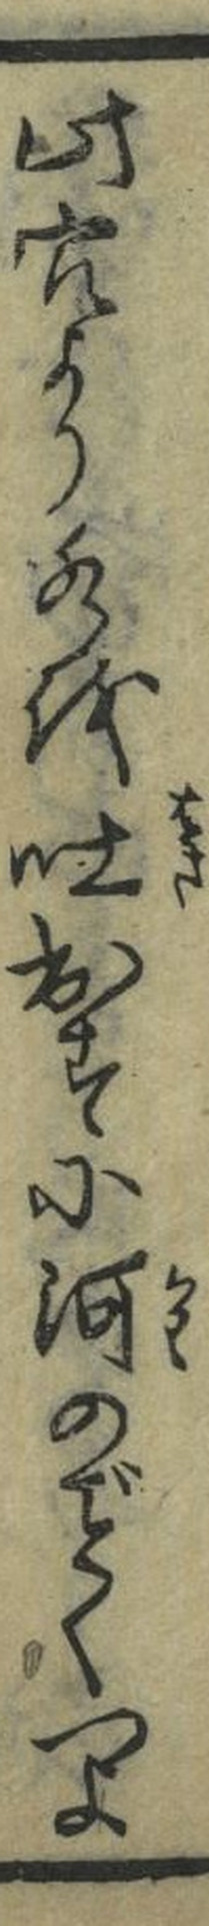此穴より水を吐出すに河のごとくつよ
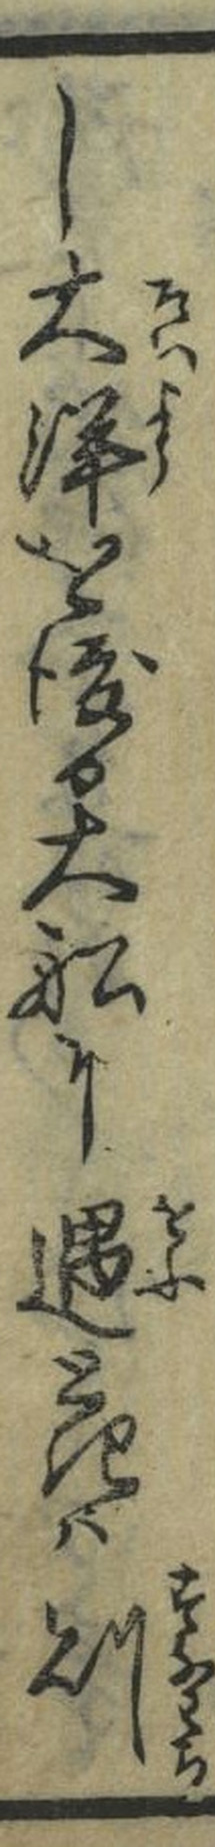し大洋を渡る大船に遭ときは則
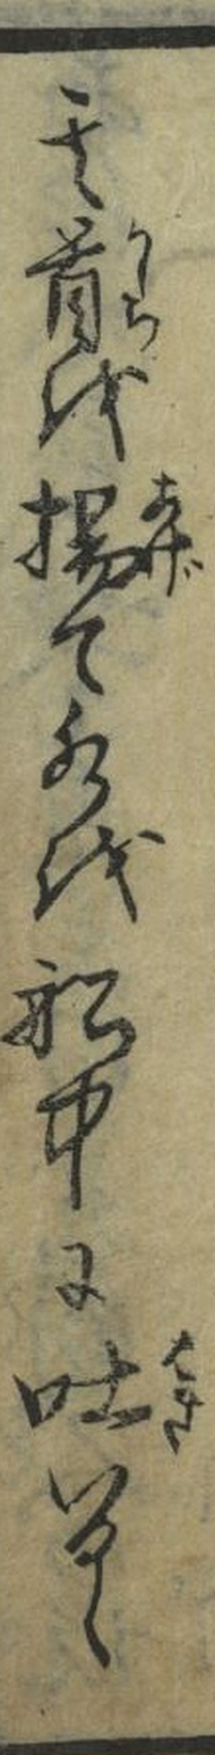其首を揚て水を船中に吐いるゝ
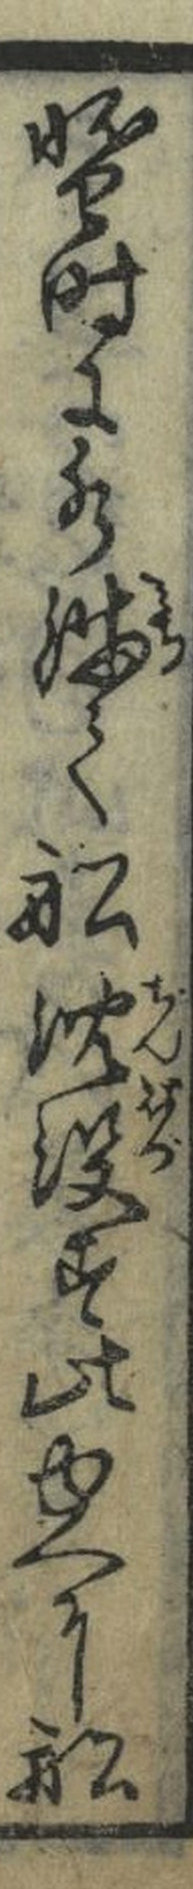は時に水満て船沈没す此ゆへに船
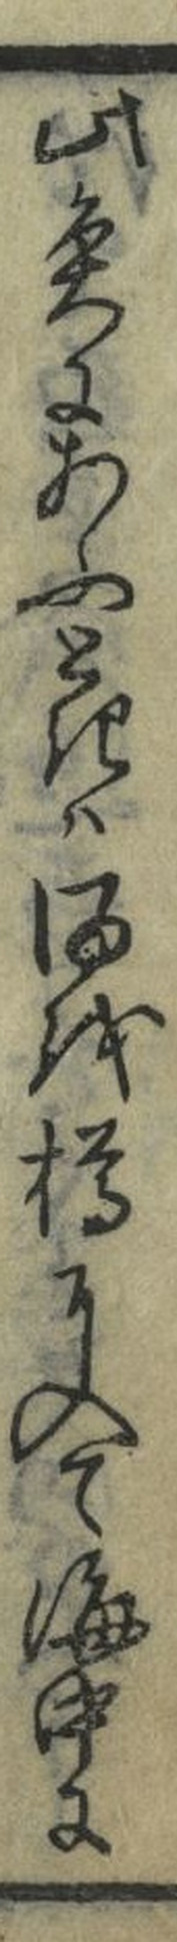此魚にあふときは酒を樽に入て海中に
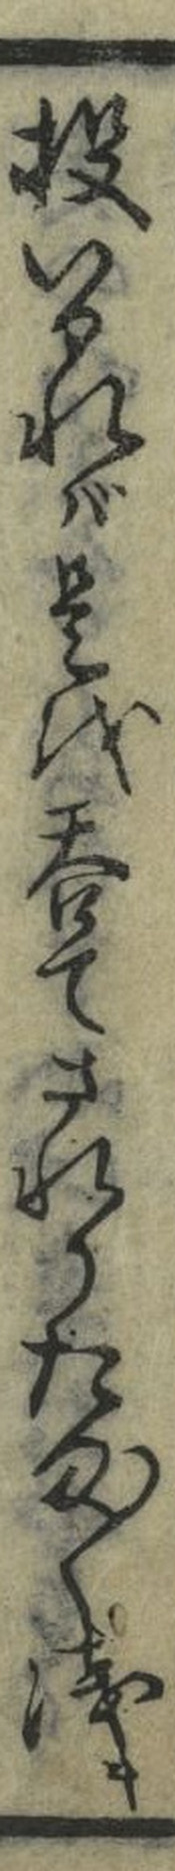投いるれば是を呑てされりたま〳〵浅き
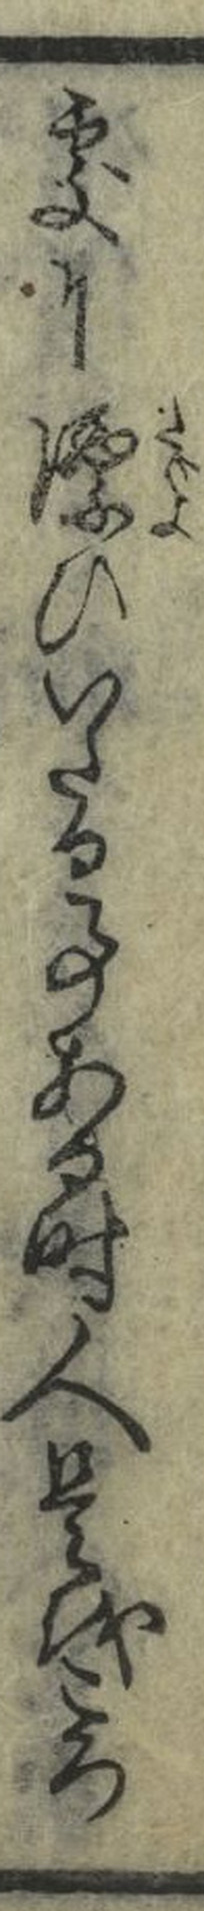処に漂ひいたる事ある時人是をころ
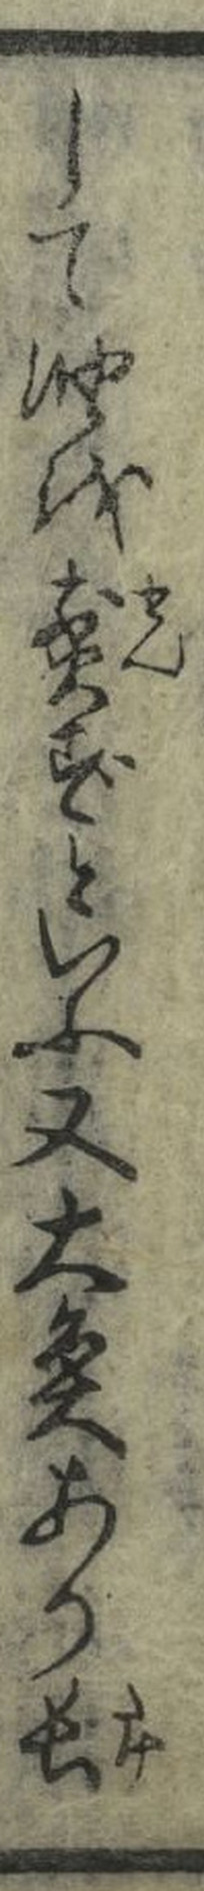して油を煎ずといふ又大魚あり長
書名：琉球雑話
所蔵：University of the Ryukyus Library
